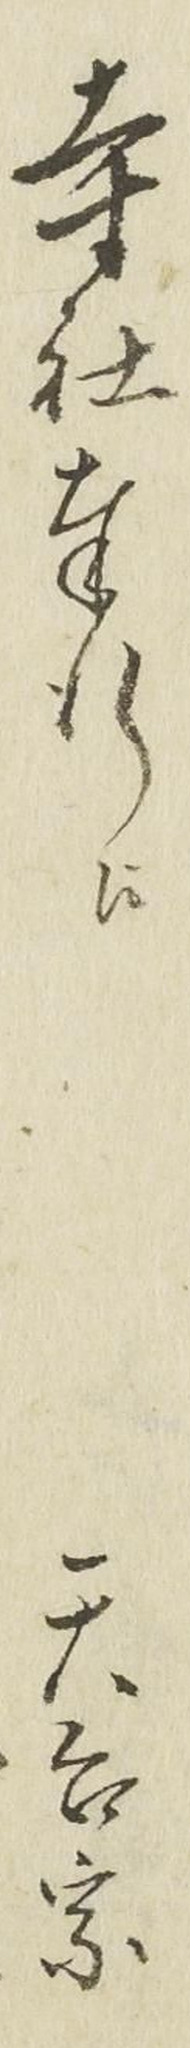寺社奉行え天台宗
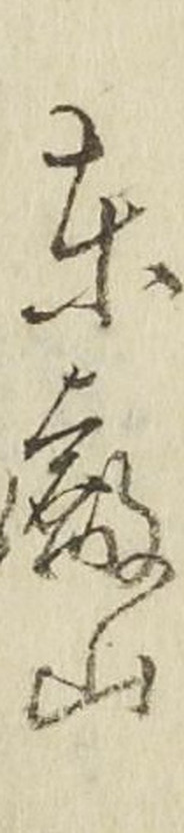東叡山
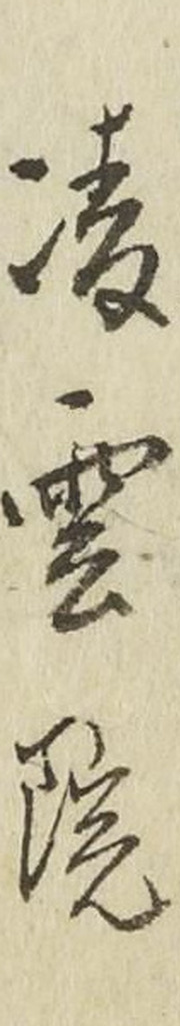凌雲院
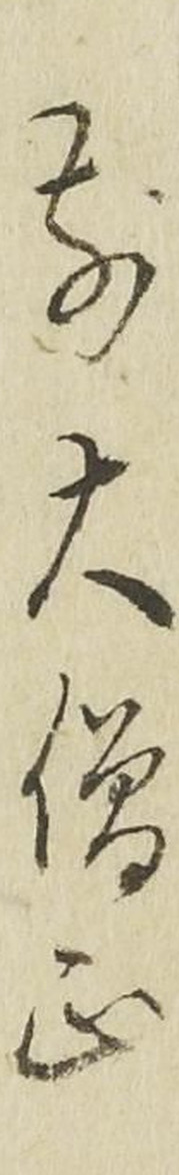前大僧正

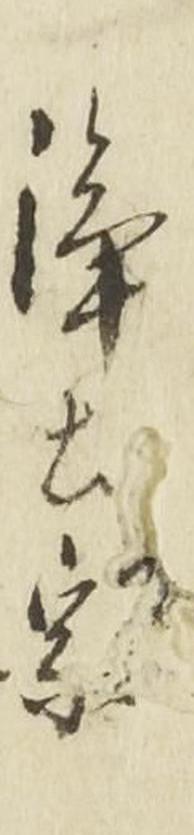浄土宗
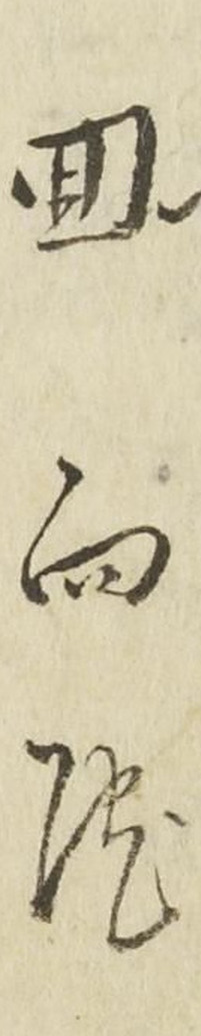回向院
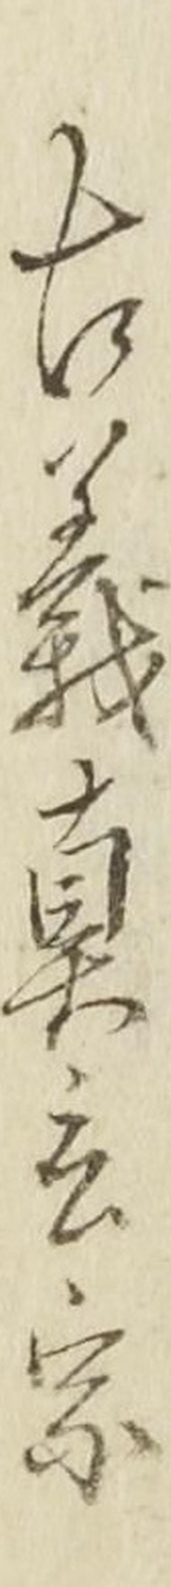古義真言宗
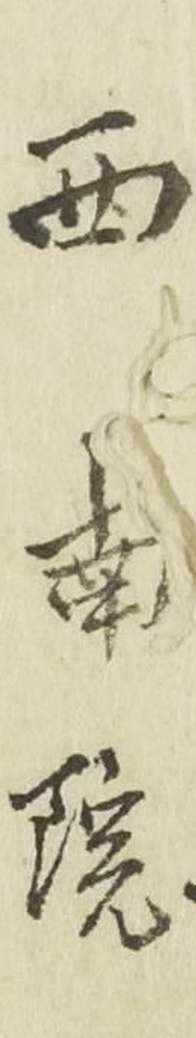西南院
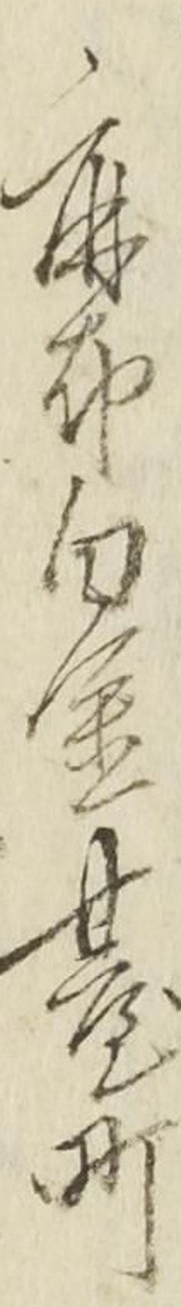麻布白金臺町
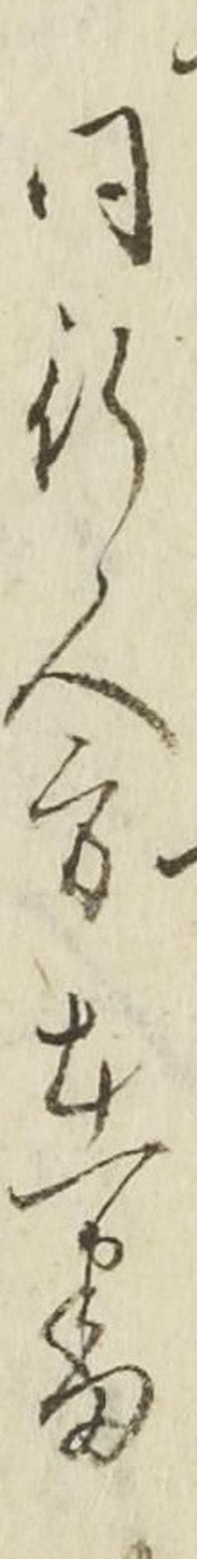同行人方在番
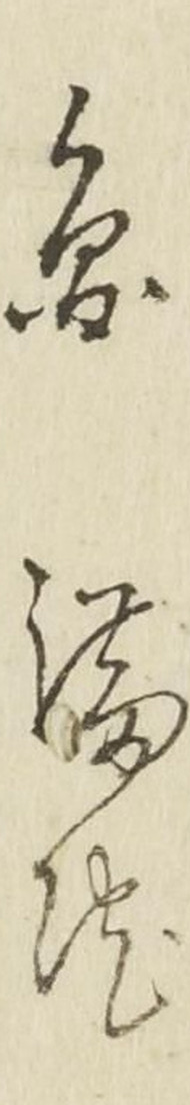円満院
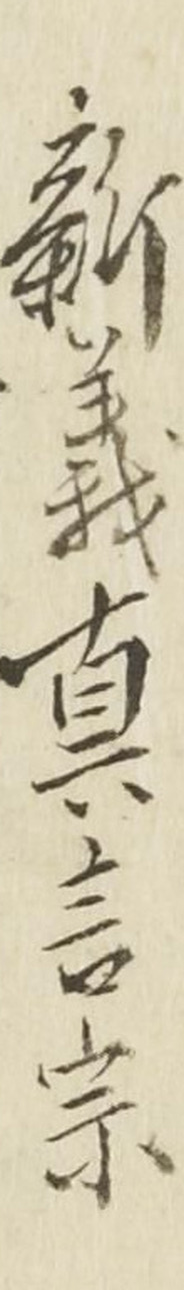古義真言宗
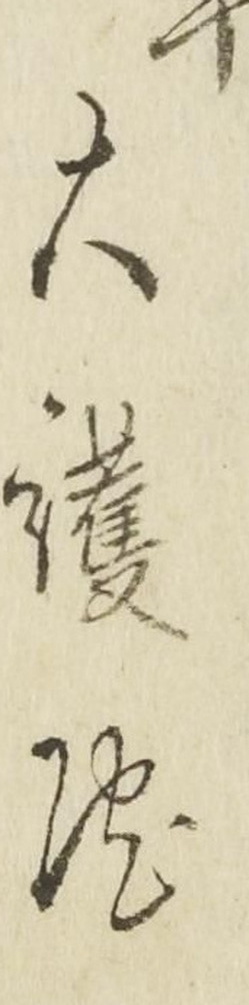大護院
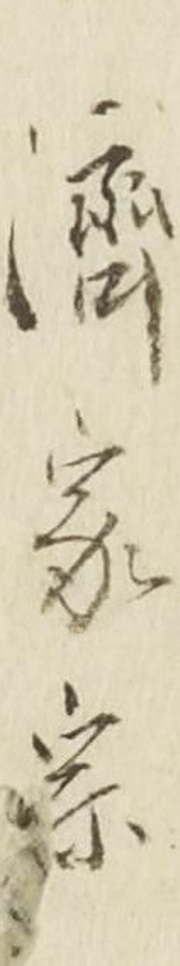済家宗
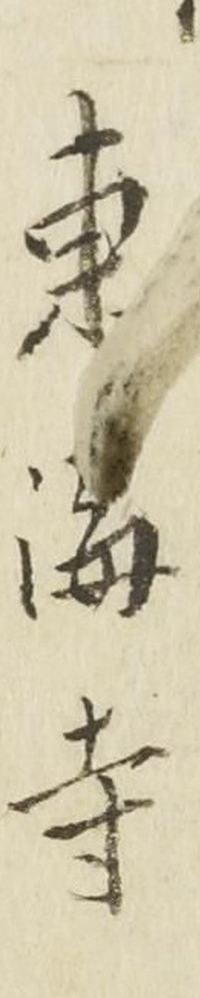東海寺
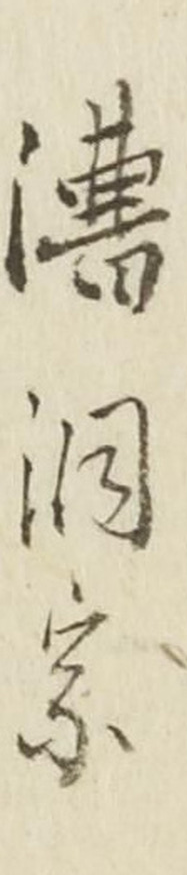曹洞宗
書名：安政二乙卯年十月二日大地震之事
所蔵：東京大学地震研究所図書室 Earthquake Research Institute Library, The University of Tokyo, JAPAN
